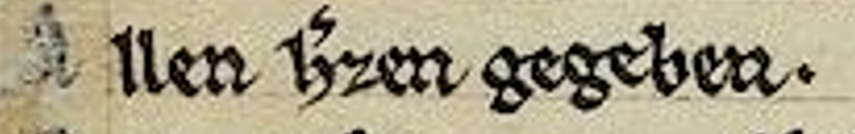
Allen h(er)zen gegeben.
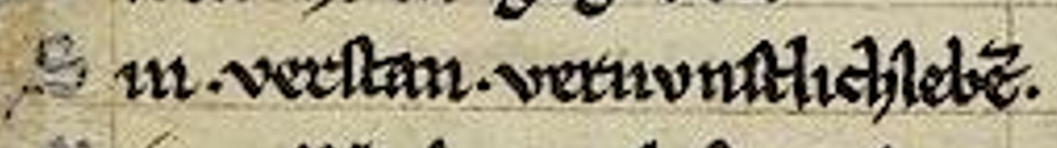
Sin. verſtan. vernvnftlichlebe(n).
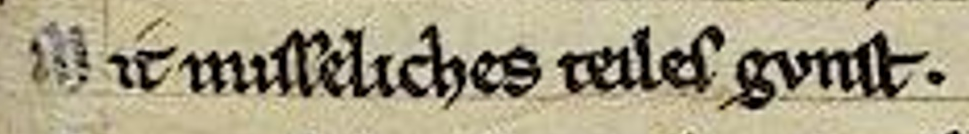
Mit miſſeliches teileſ gvnſt.
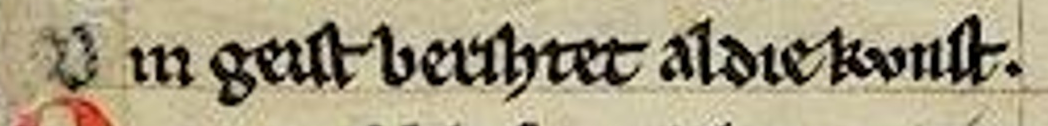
Din geiſt berihtet aldie kvnſt.
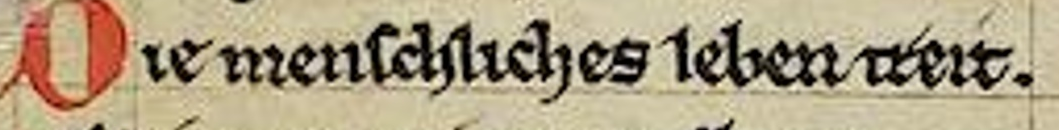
*Die menſchliches leben treit.
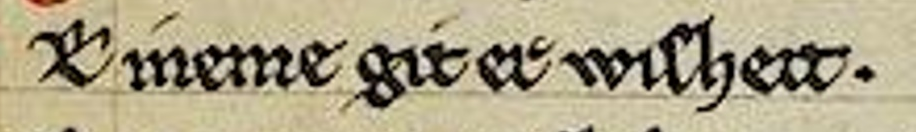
Eineme git er wiſheit.
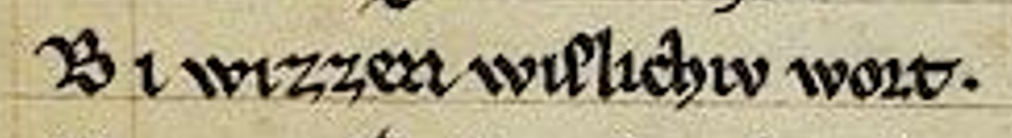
Bi wizzen wiſlichiv wort.
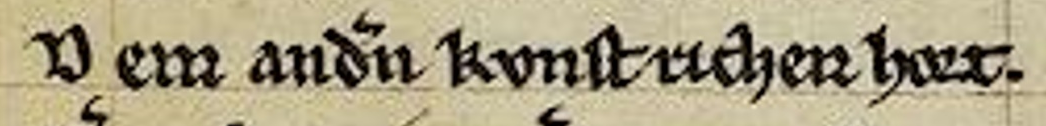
Dem and(er)n kvnſt richen hort.
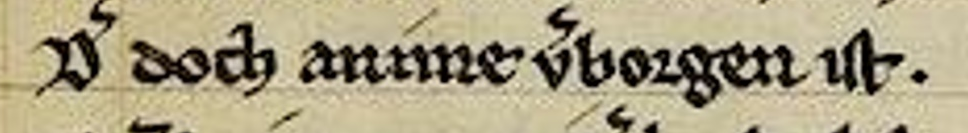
D(er) doch anime v(er)borgen iſt.
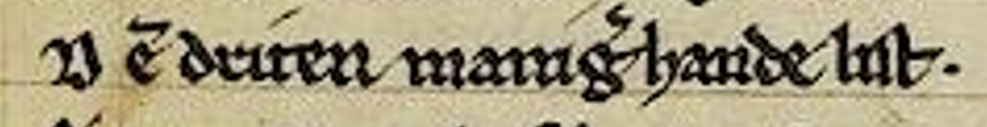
De(m) driten manig(er) hande liſt.
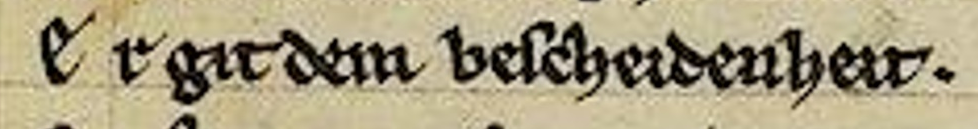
Er git dem beſcheidenheit.
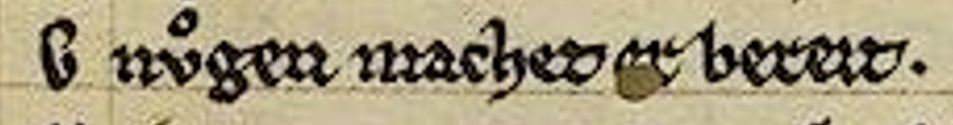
Gnv°ogen machet er bereit.
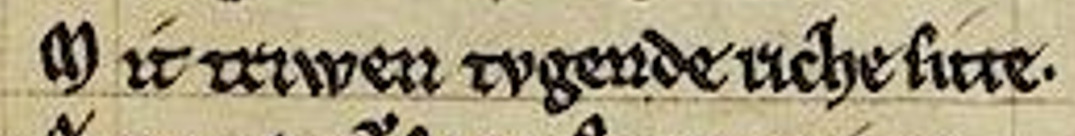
Mit triwen tvgende riche ſitte.
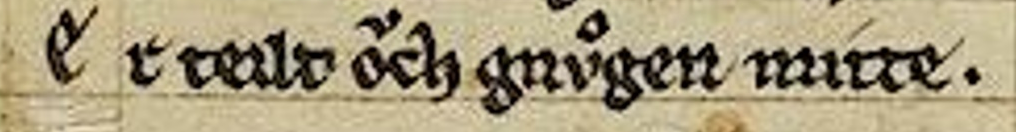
Er teilt o°vch gnv°ogen mitte.
